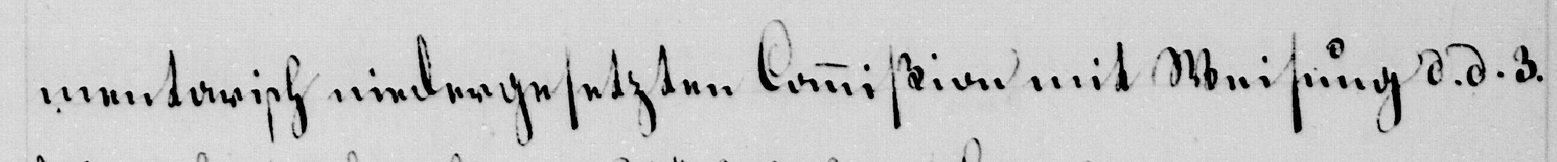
mentarisch niedergesetzten Commißion mit Weisung d. d. 3.
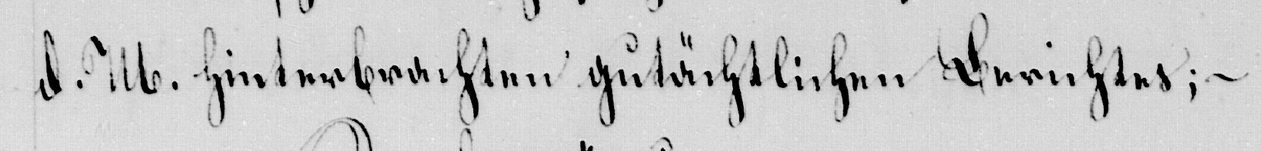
d. M. hinterbrachten gutächtlichen Berichtes; –
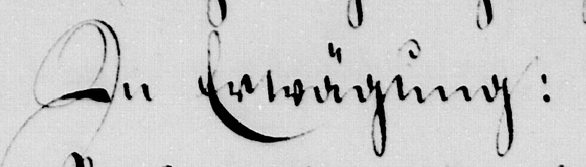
In Erwägung:
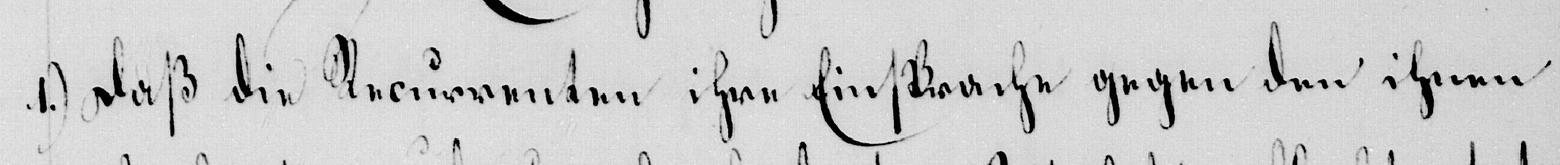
1.) Daß die Recurrenten ihre Einsprache gegen den ihnen
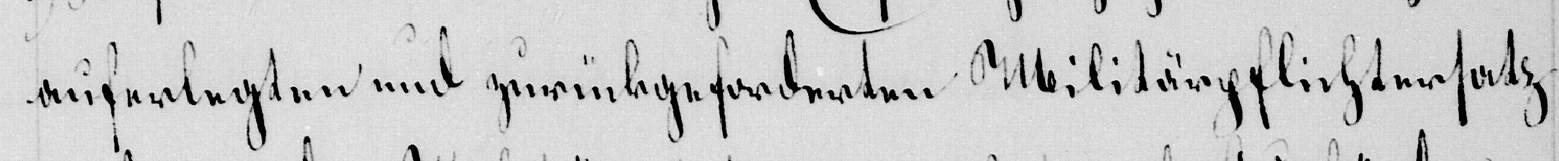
auferlegten und zurückgeforderten Militärpflichtersatz
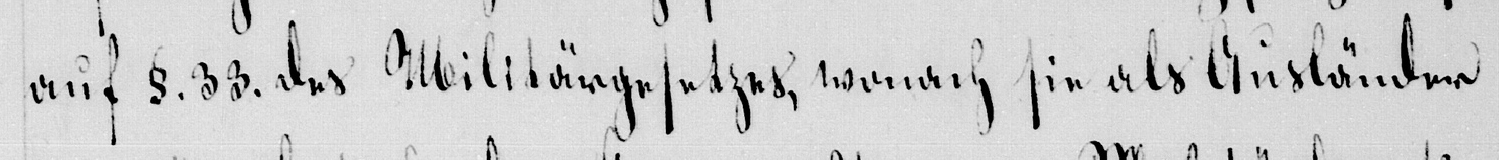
auf §. 33. des Militärgesetzes, wonach sie als Ausländer
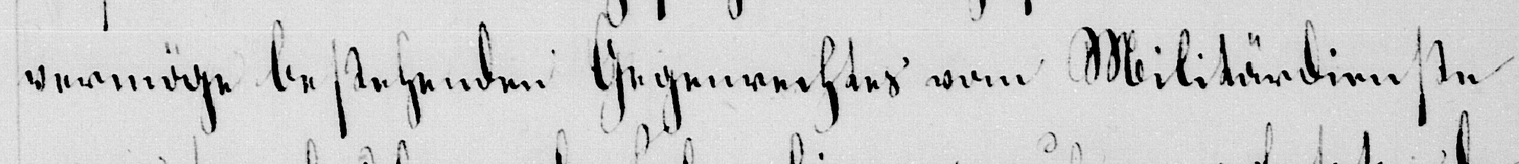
vermöge bestehenden Gegenrechtes vom Militärdienste
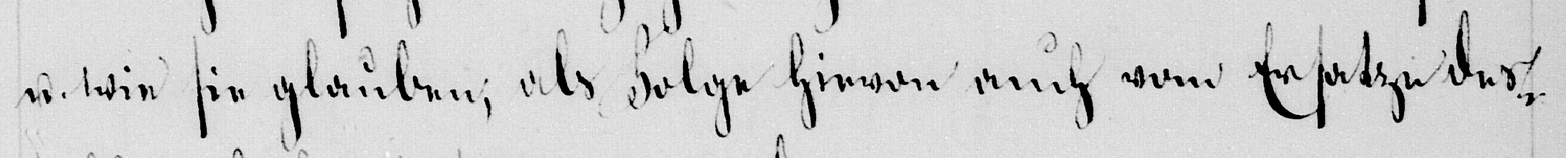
u. wie sie glauben, als Folge hiervon auch vom Ersatze des¬
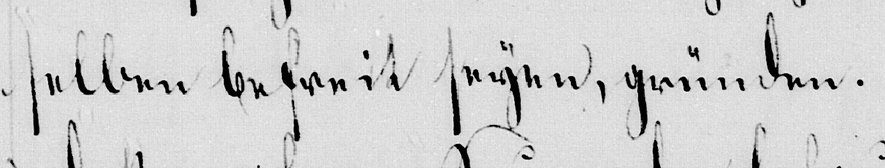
selben befreit seyen, gründen.
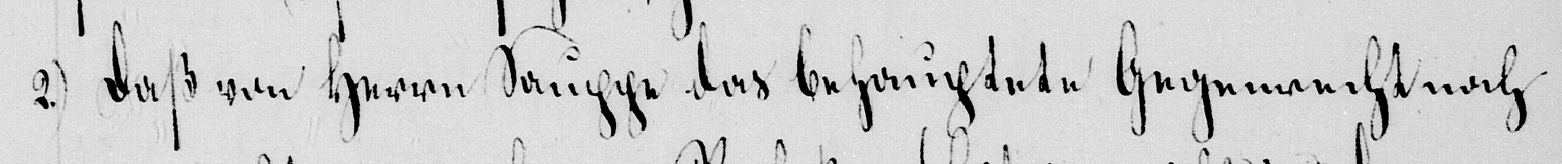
2.) Daß von Herrn Sauppe das behauptete Gegenrecht noch
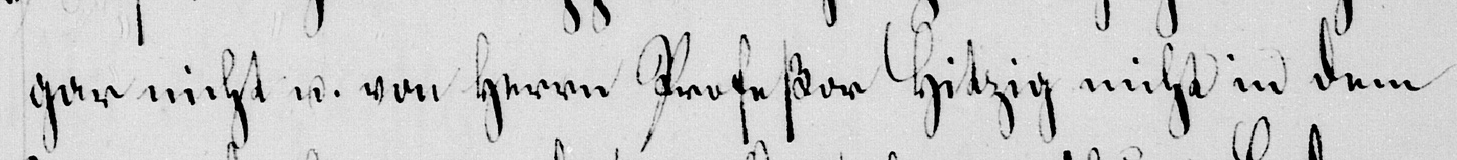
gar nicht u. von Herrn Profeßor Hitzig nicht in dem
